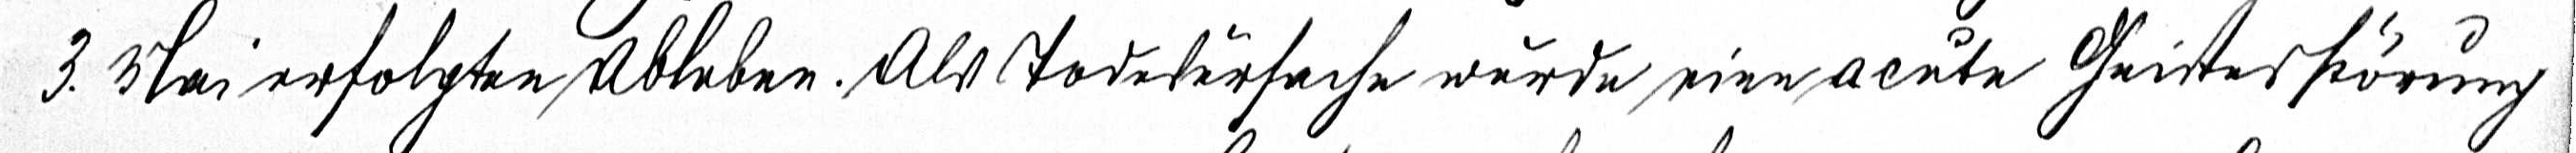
3. Mai erfolgten Ableben. Als Todesursache wurde eine acute Geistesstörung
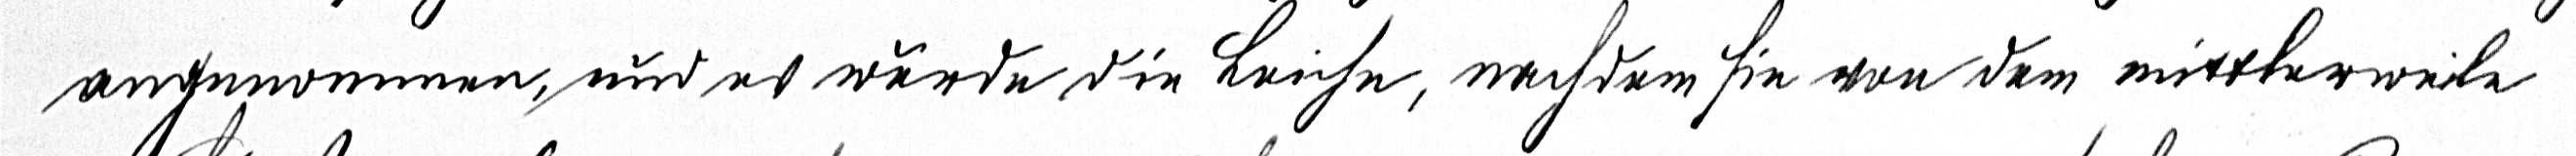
angenommen, und es wurde die Leiche, nachdem sie von dem mittlerweile
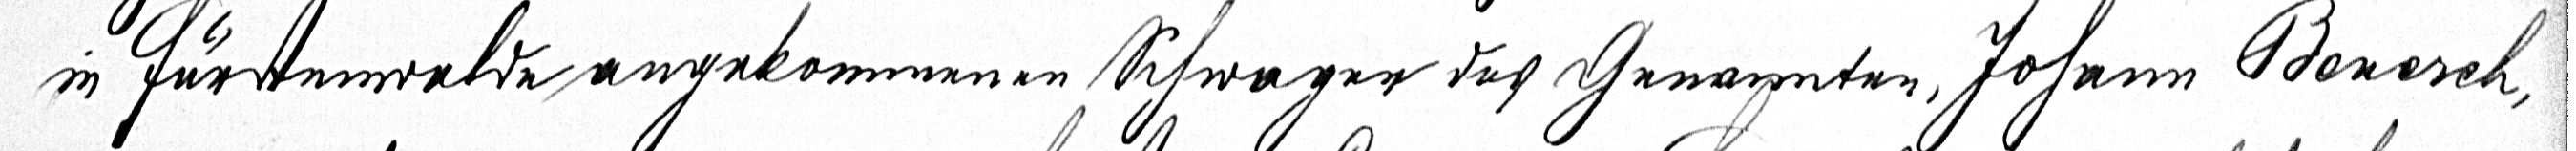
in Fürstenwalde angekommenen Schwager des Genannten, Johann Bonesch,
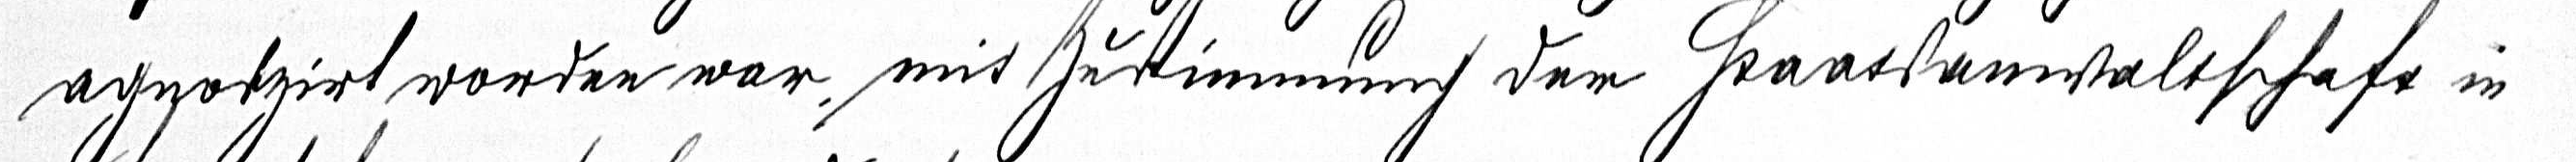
agnoszirt worden war mit Zustimmung der Staatsanwaltschaft in
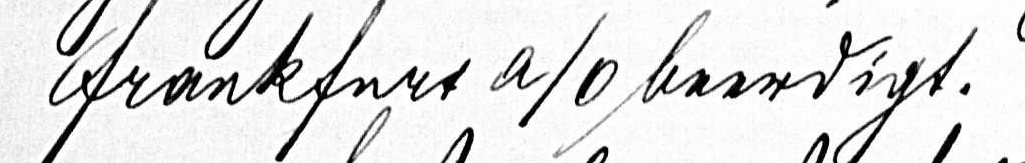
Frankfurt a/O beerdigt.
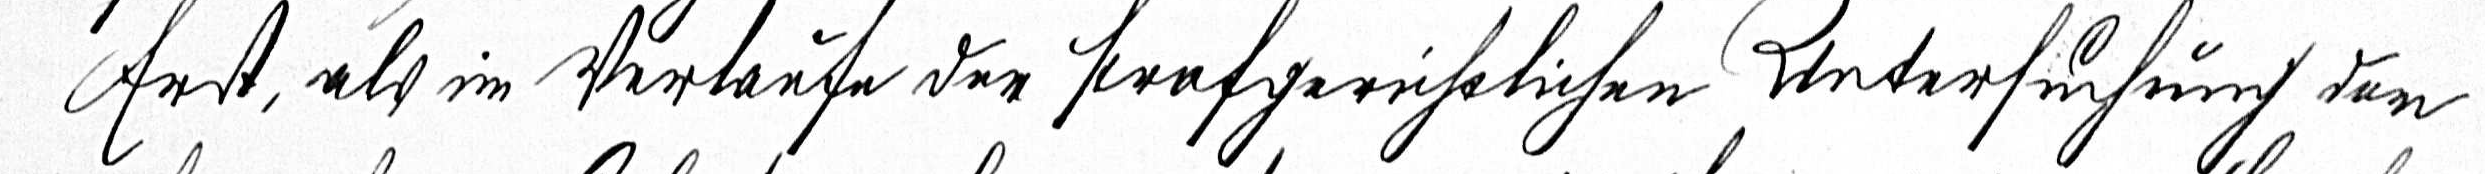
Erst, als im Verlaufe der strafgerichtlichen Untersuchung der
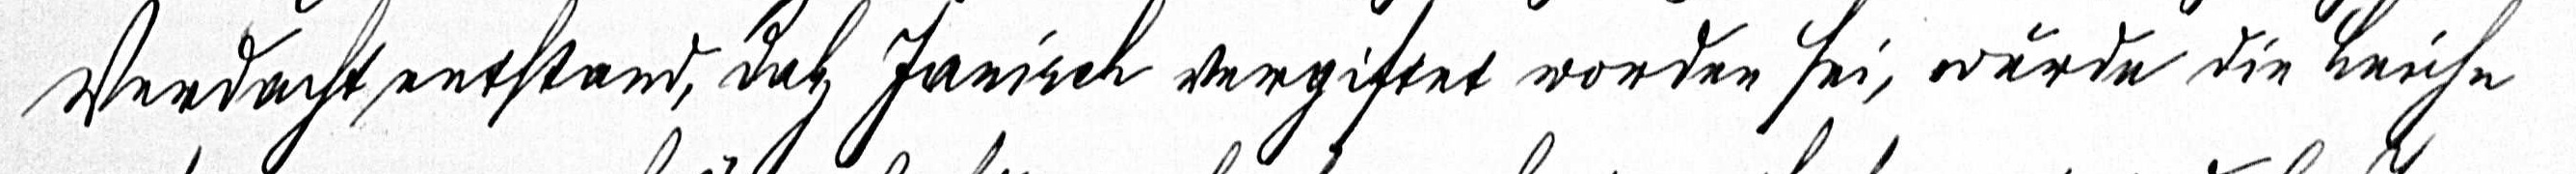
Verdacht entstand, daß Janisch vergiftet worden sei, wurde die Leiche
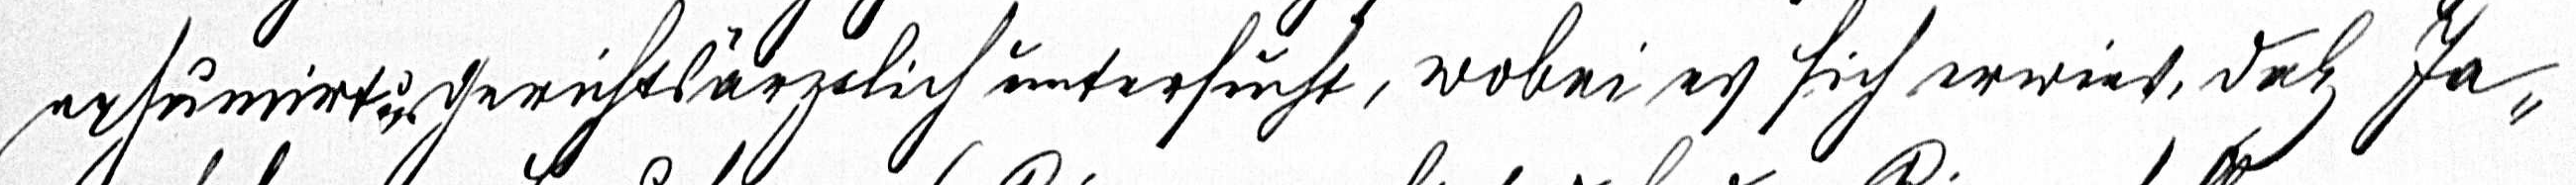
exhumirt u gerichtsärztlich untersucht, wobei es sich erwies, daß Ja¬
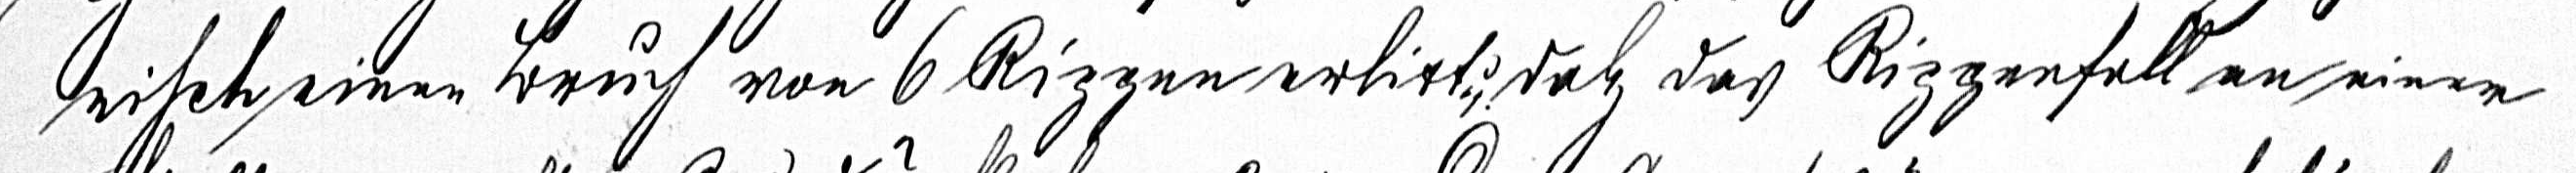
nisch einen Bruch von 6 Rippen erlitt, daß das Rippenfell an einer
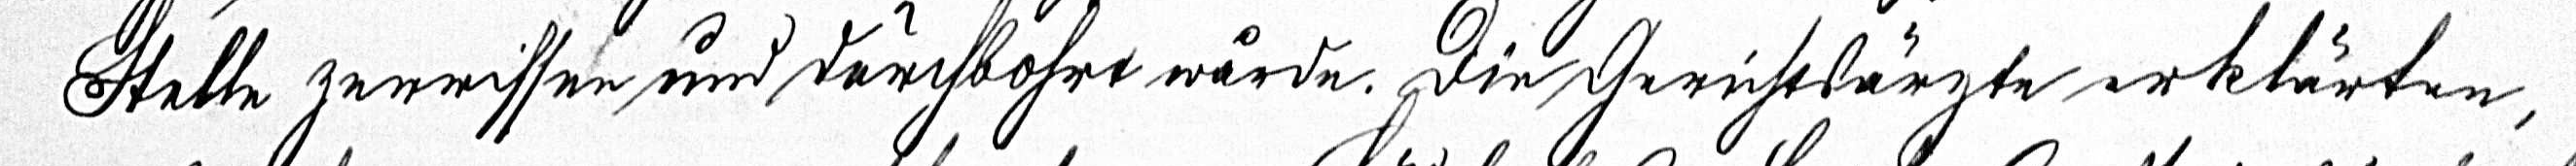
Statte zerrissen und durchbohrt wurde. Die Gerichtsärzte erklärten,
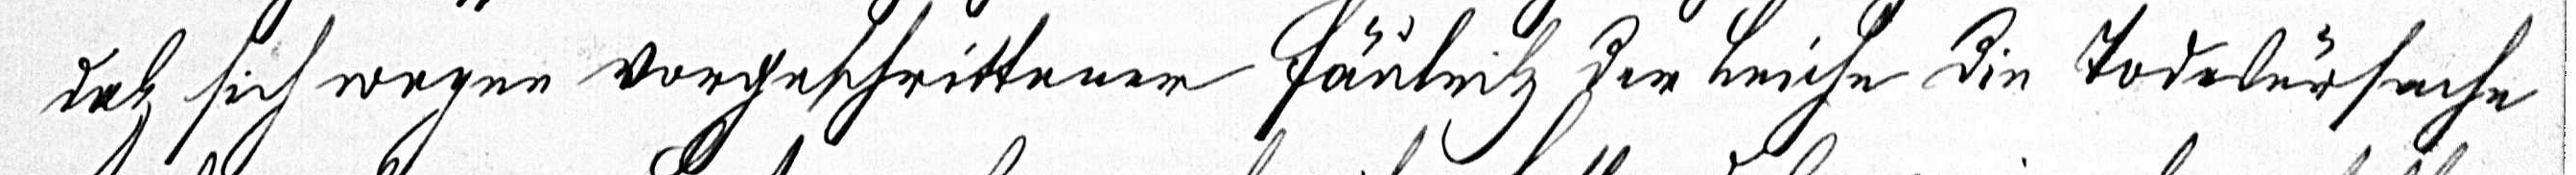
daß sich wegen vorgeschnittener Fäulniß der Leiche die Todesursache
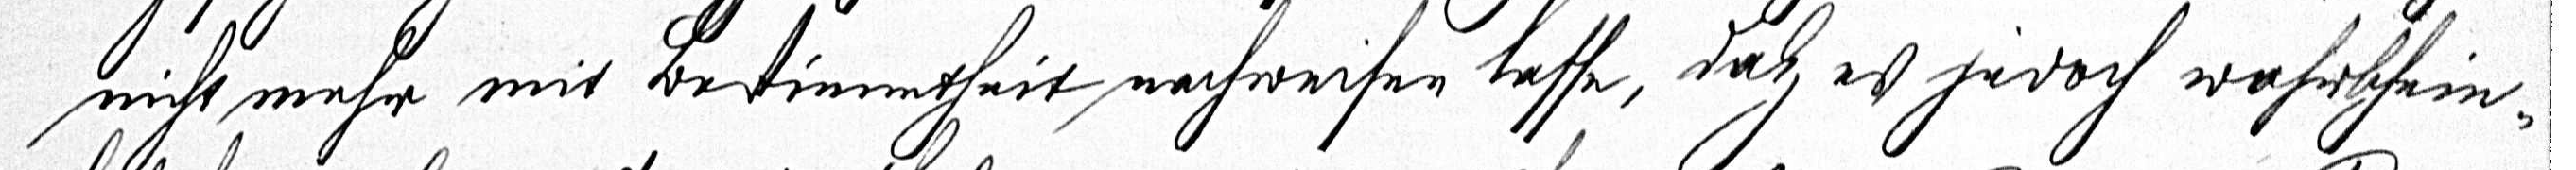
nicht mehr mit Bestimmtheit nachweisen lasse, daß es jedoch wahrschein¬
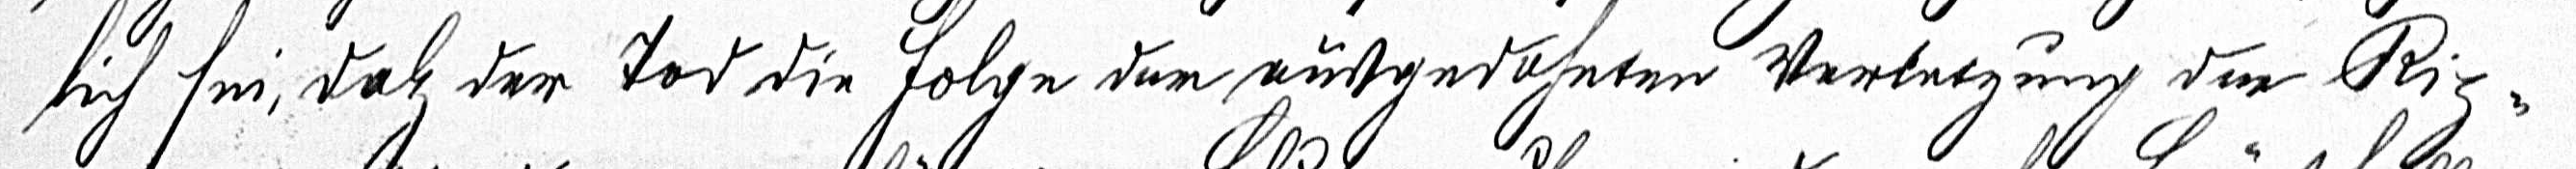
lich sei, daß der Tod die Folge der ausgedehnten Verletzung der Rip¬
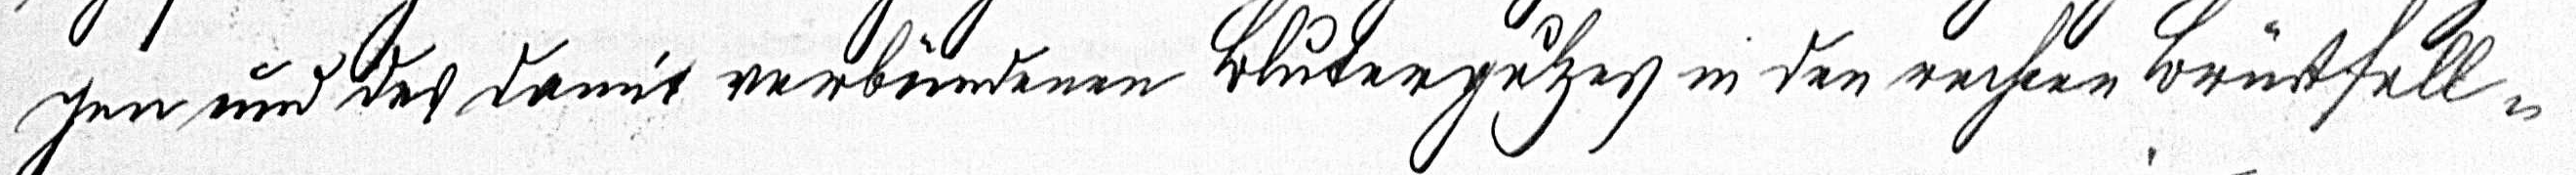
pen und das damit verbündenen Blutergußes in den rechen Brüstfell¬
